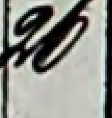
26
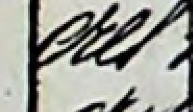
Alt
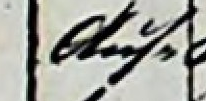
Aus„
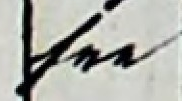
see
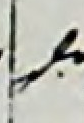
Do
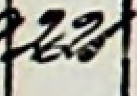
226
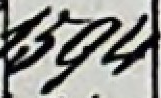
1594
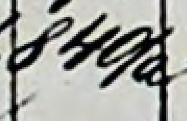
840/a
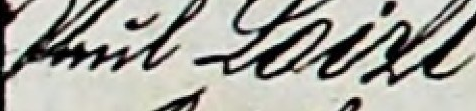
Paul Loizl
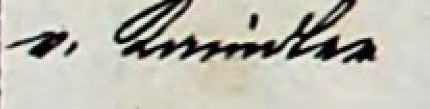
v. Kaindler-
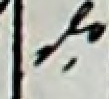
Do
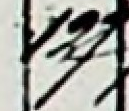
127
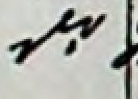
Do
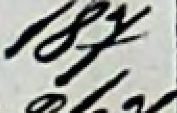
187
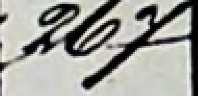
267
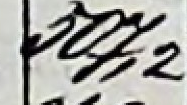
507,2
